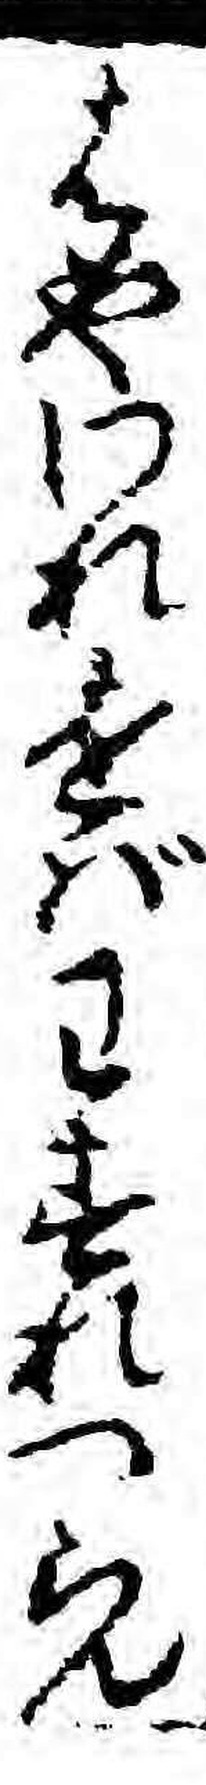はやわれをばわすれつらん
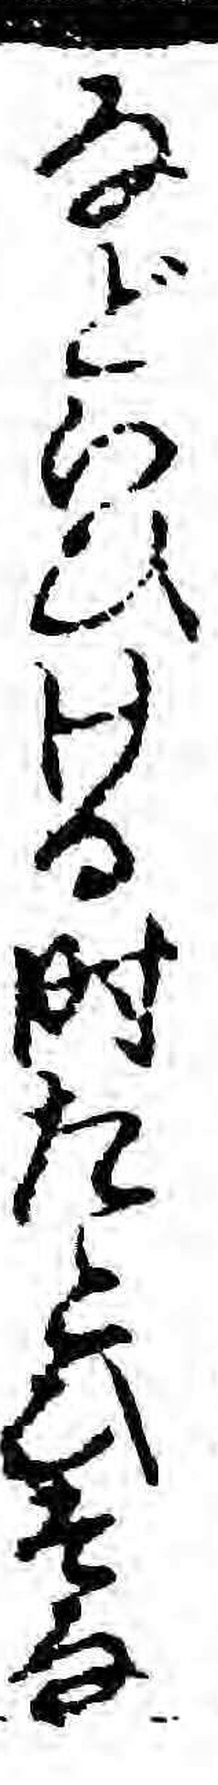などいひける時たとひそな
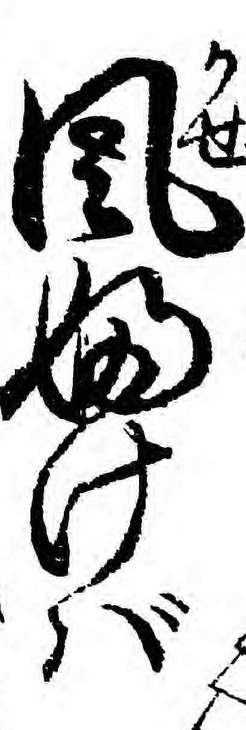風ふけば
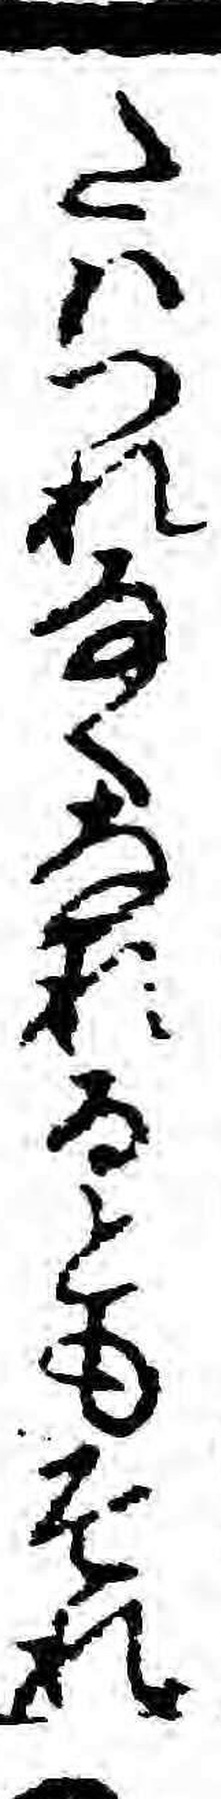たはつれなくなれるともそれ
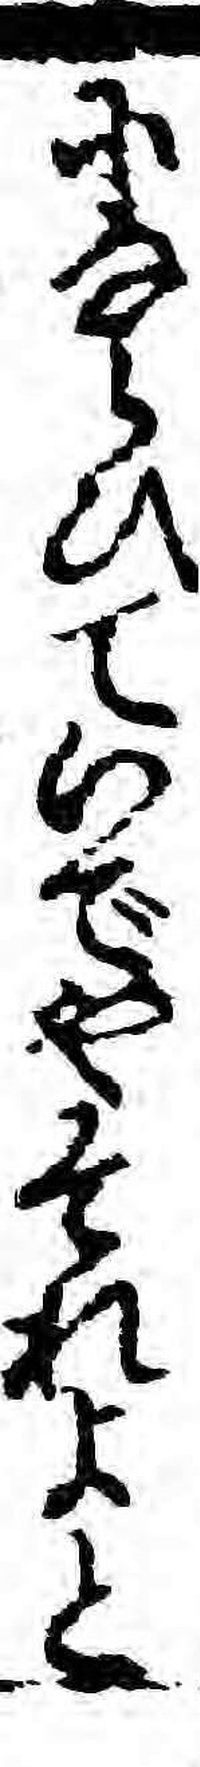にならひていでやそれよと
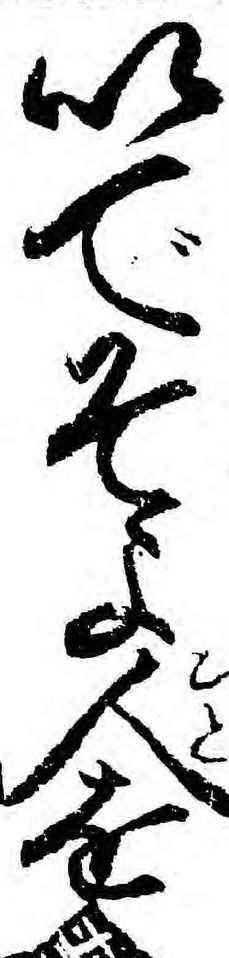いでそよ人を
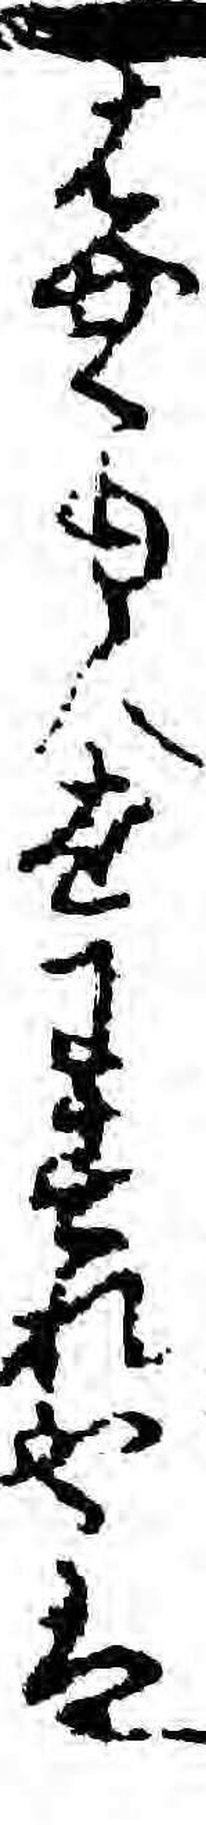はやくも人をわすれやは
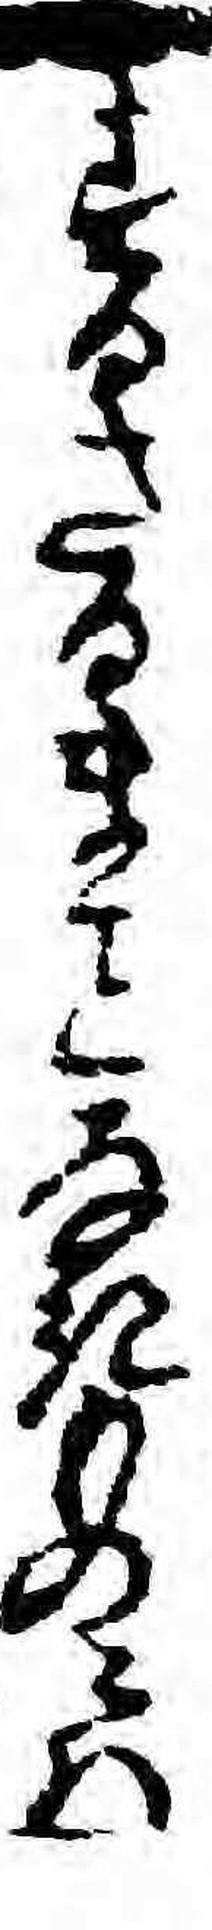するさるまことなきものには
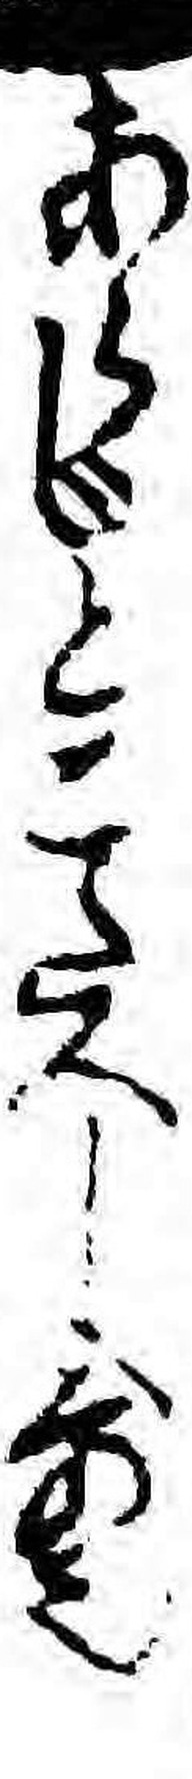あらじとこたへし哥也
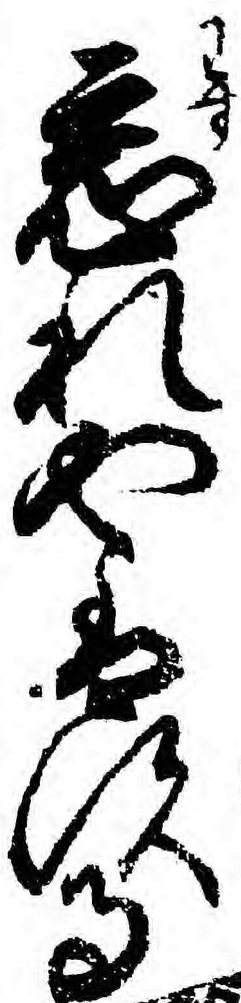忘れやはする
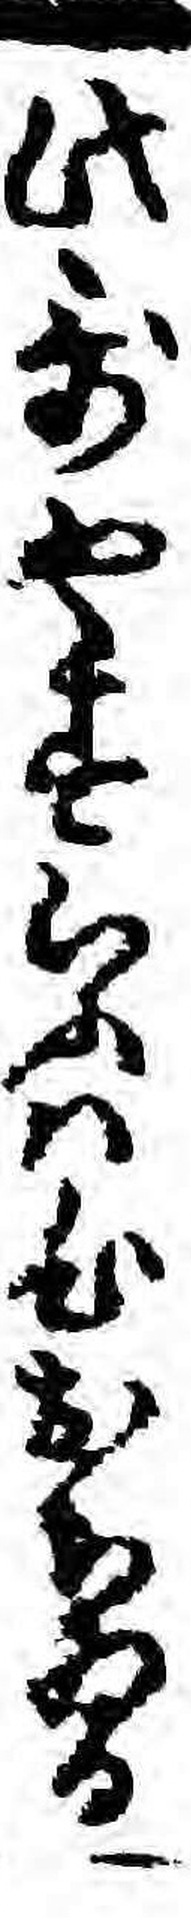此哥やすらふは心おちゐる
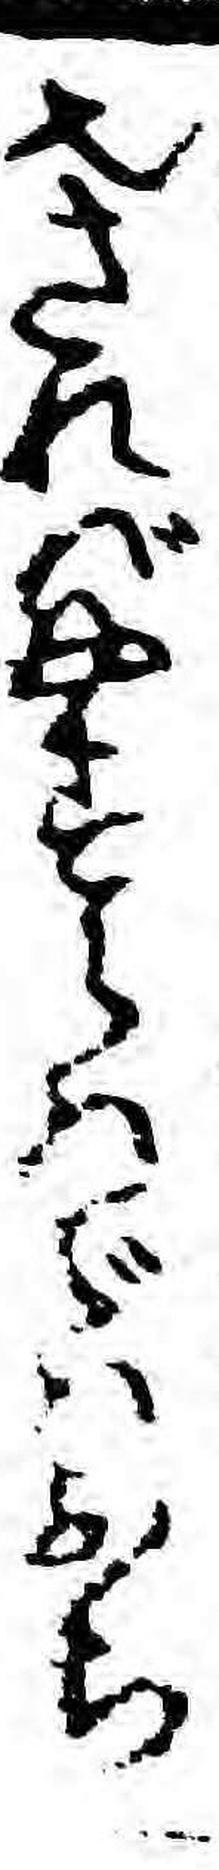也さればやすらはではおち
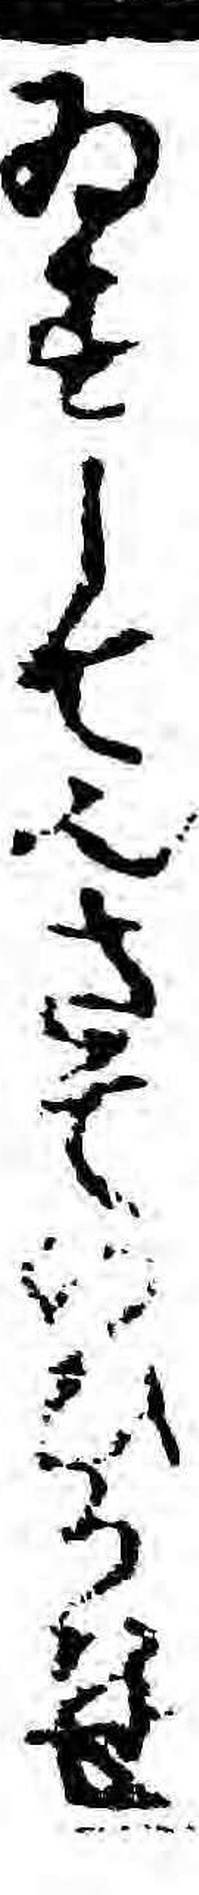ゐすして也さていひかはせ
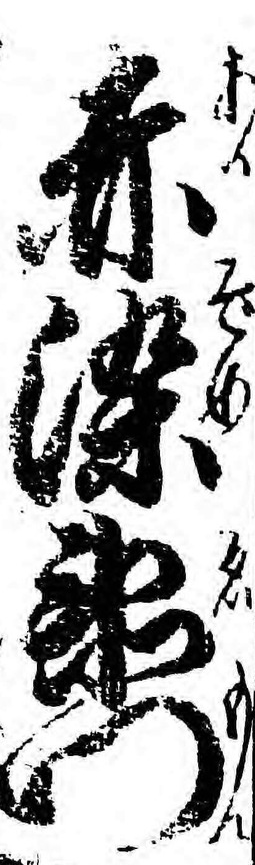赤染衛門
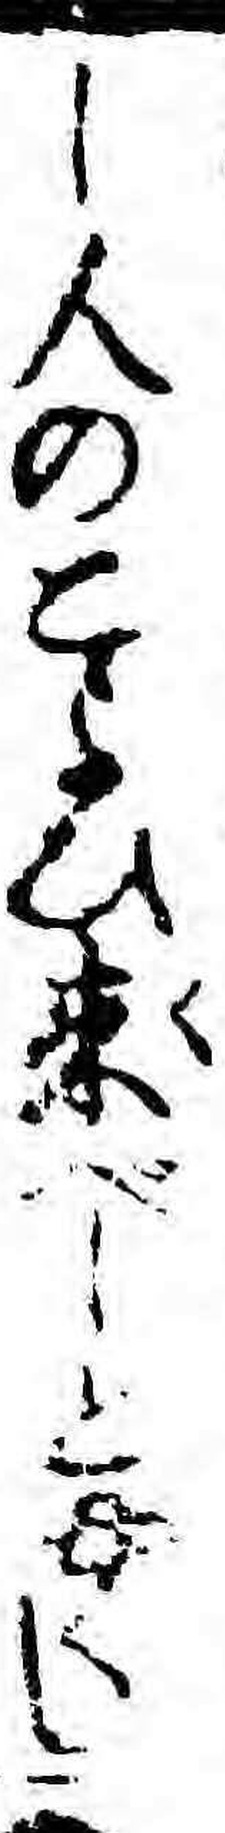し人のこよひ来べしとやくし
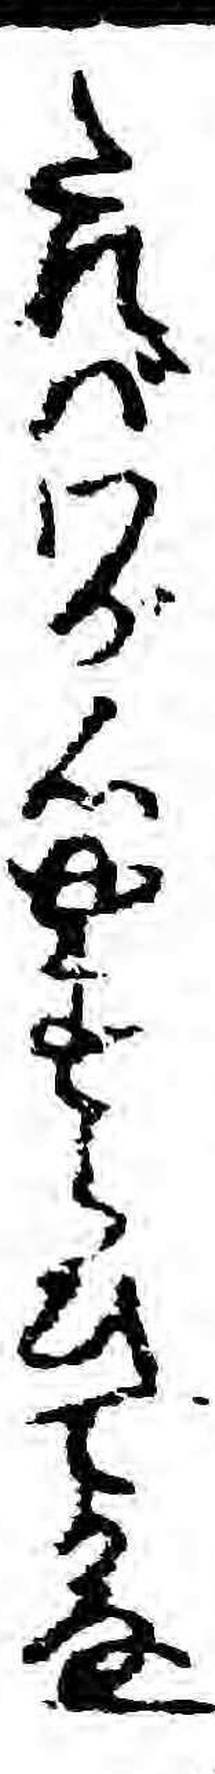たればわが心やすらひてかな
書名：頭書和歌注譯／壽賀多百人一首小倉錦
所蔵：国文学研究資料館
